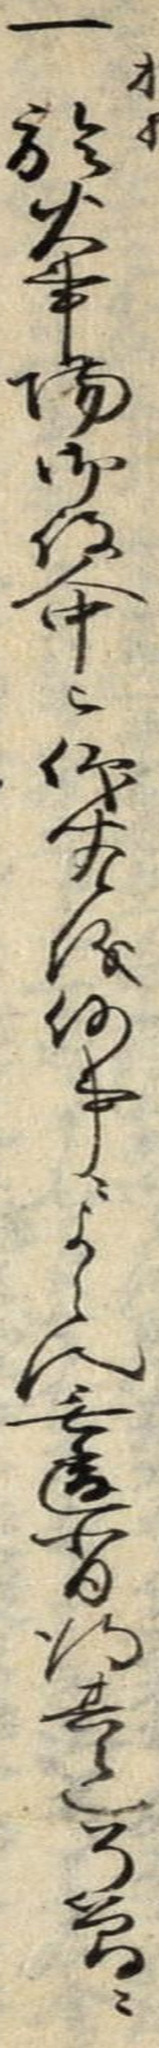一於火事場御役人中被仰聞候儀何事によらす無違背得其意了簡に
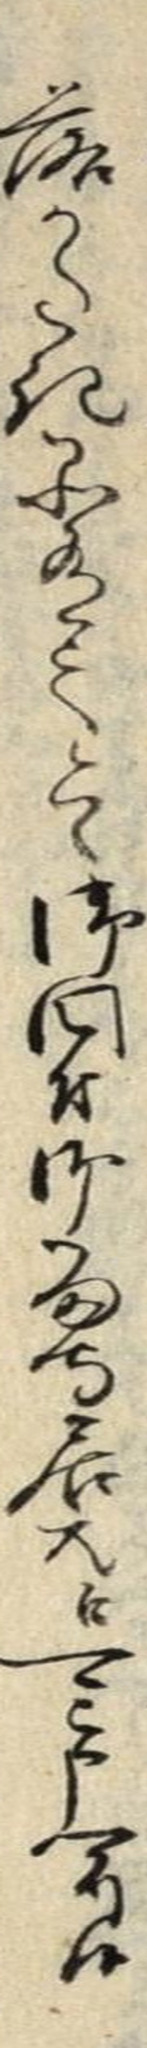落かたき品有之候はゝ御目付御留守居共江可被申聞候
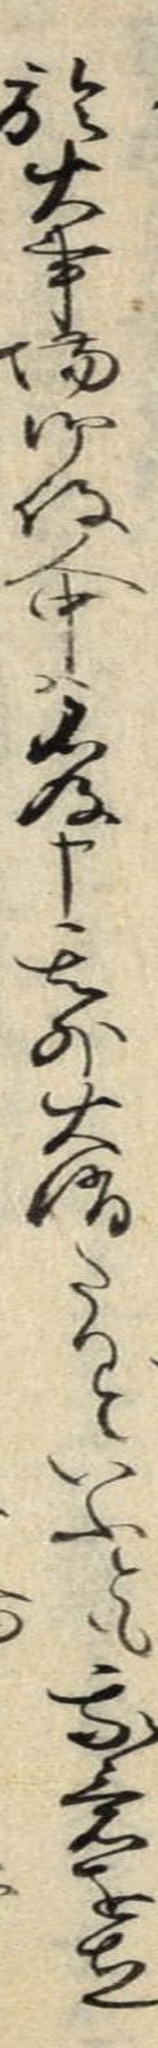一於火事場御役人中は不及申其外火消たりといふとも我意を立
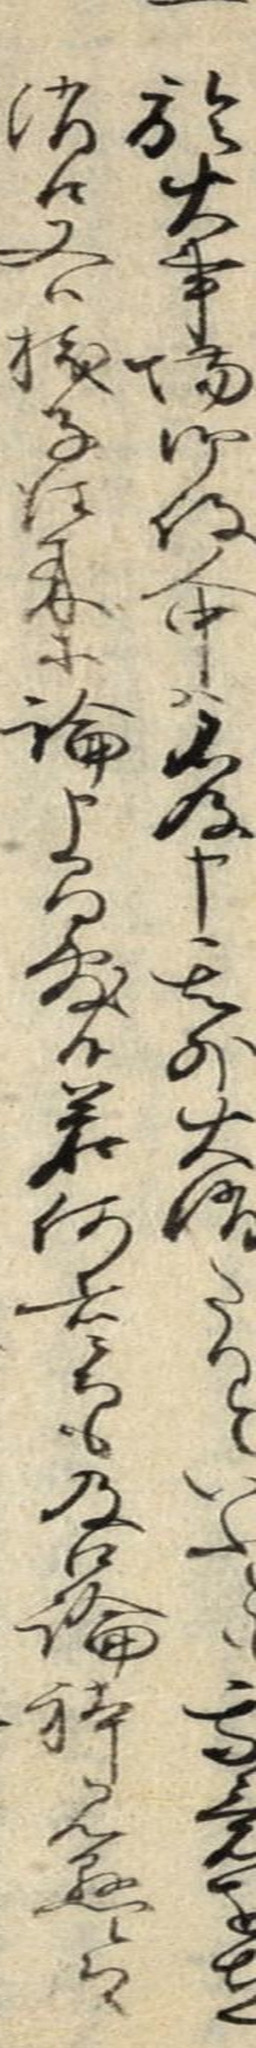消口又は梯子往来等論申間敷候若何者にても及口論体見懸候はゝ
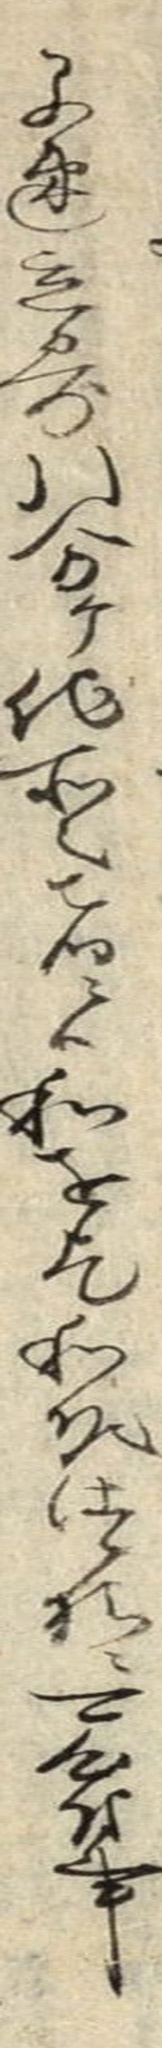早速立寄引分け他所之者には和を乞和順仕候様に可心付事
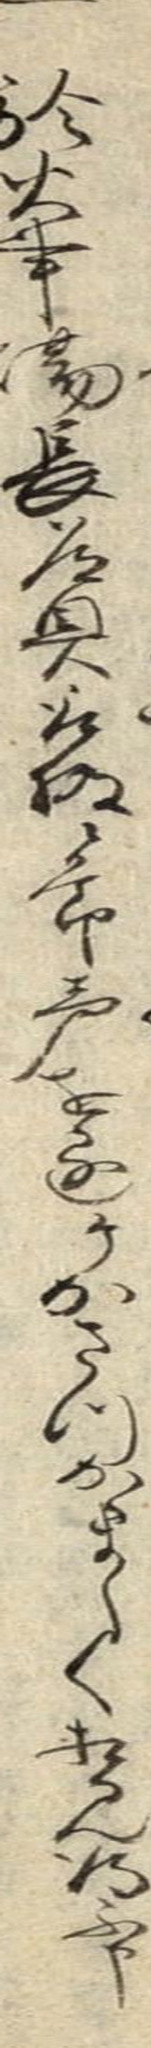一於火事場長道具取扱候節声を懸けかさつかましく相見得不申
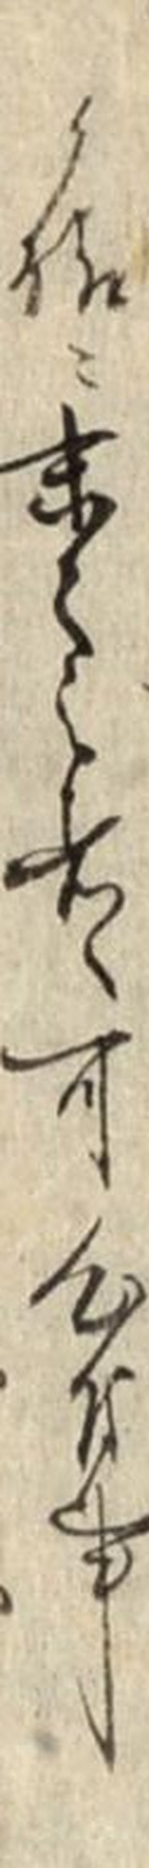候様に末々之者へ可心付事
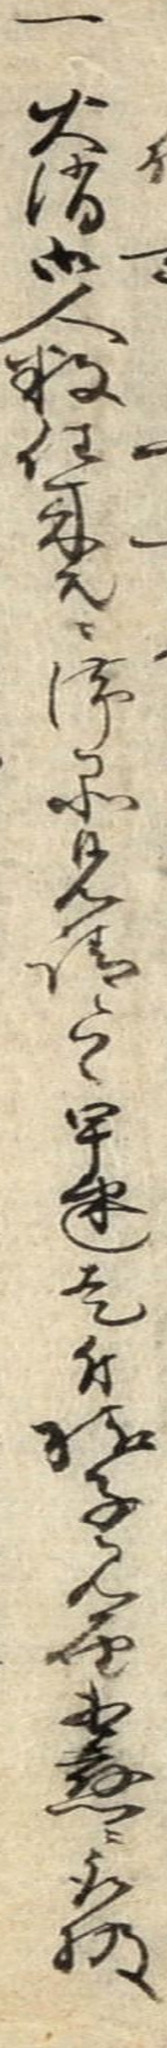一火消御人数往来共に滞品見請候はゝ早速走付様子見届相応に取扱
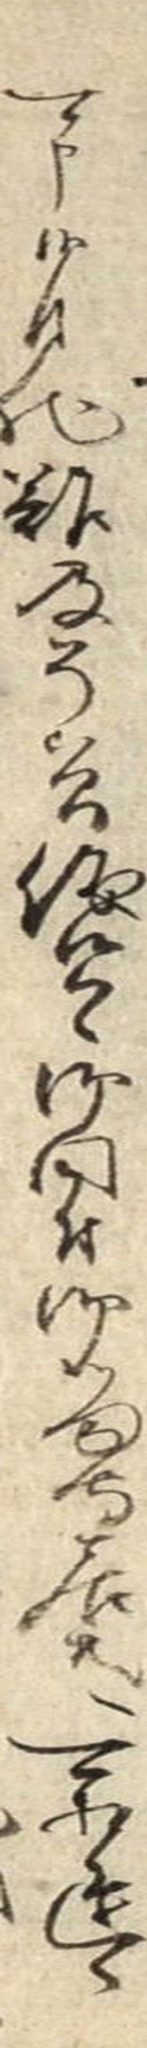可申候自然難及了簡儀候はゝ御目付御留守居共へ可相達候
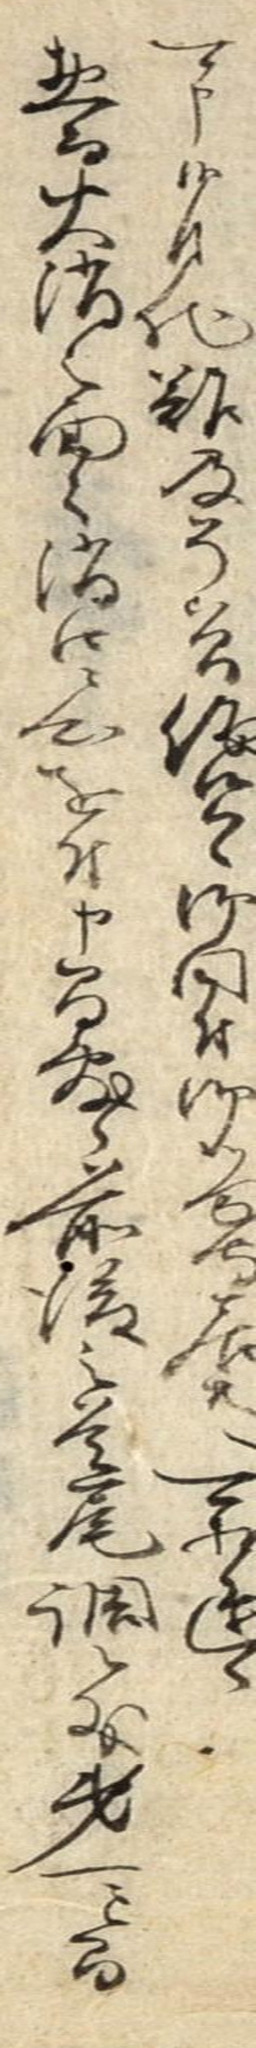一惣て火消之面々消口に心を付申間敷候前後之首尾調候義第一に候間
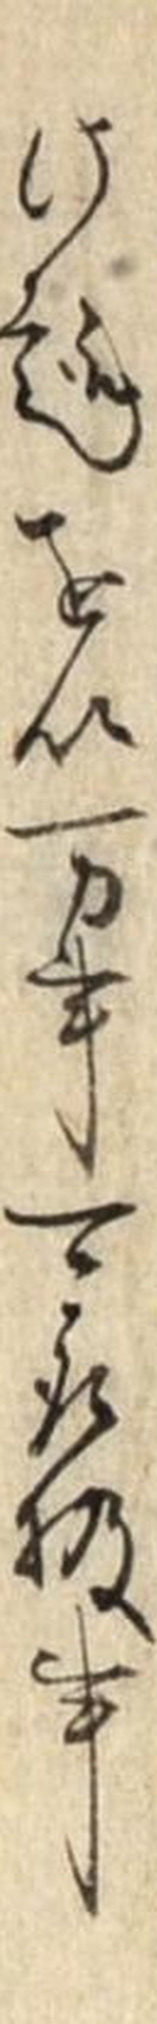此趣を以万事可取扱事
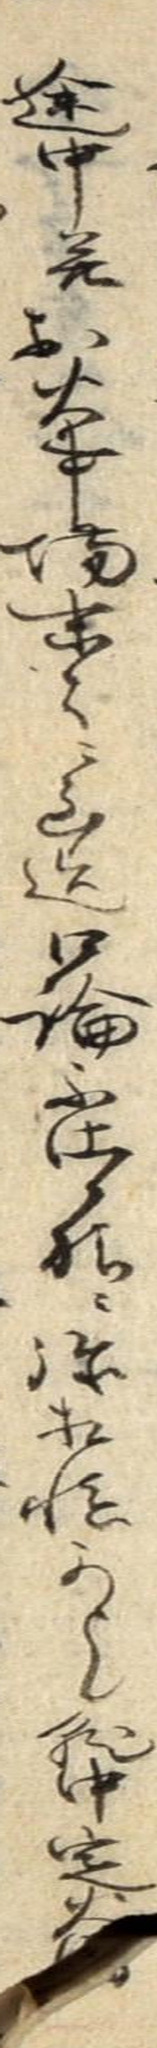一途中并於火事場末々に至迄口論不仕候様に弥相慎可申候就中定火消
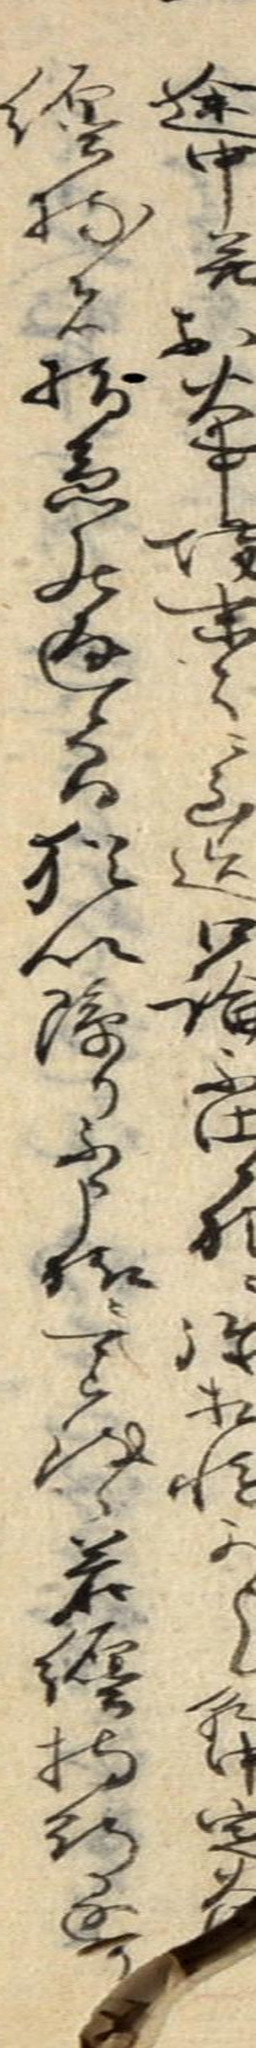纏持は指急罷通候間猶以障り不申様に可被致候若纏持行懸り

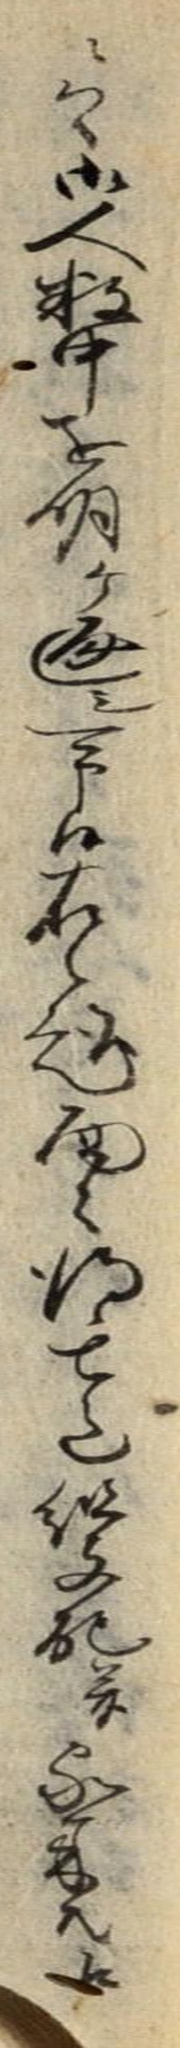候はゝ御人数中を明け通し可申候右之趣面々得其意組支配并家来共江
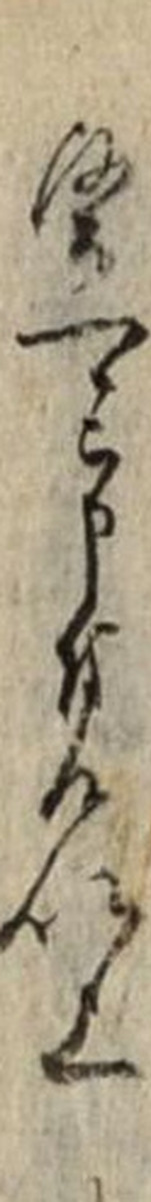堅可被申付候以上
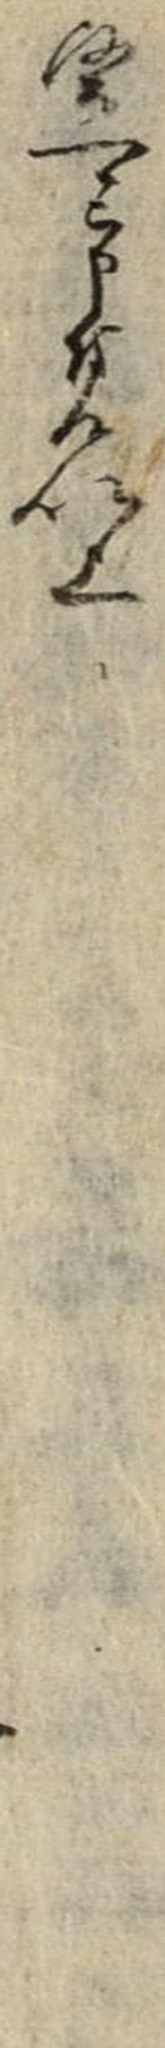堅可被申付候以上
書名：三都并道中之部
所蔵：福井県文書館 Fukui Prefectural Archives
